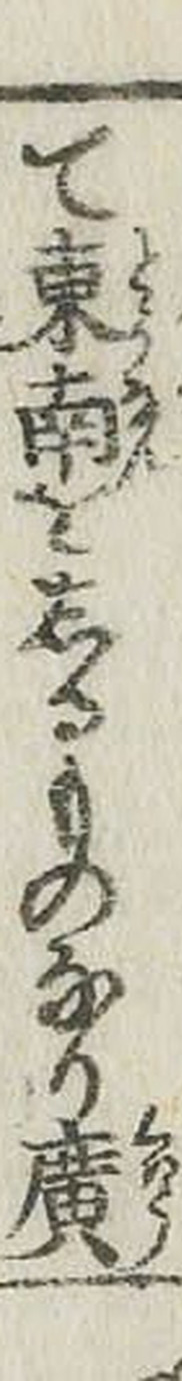て東南をしるものなり広
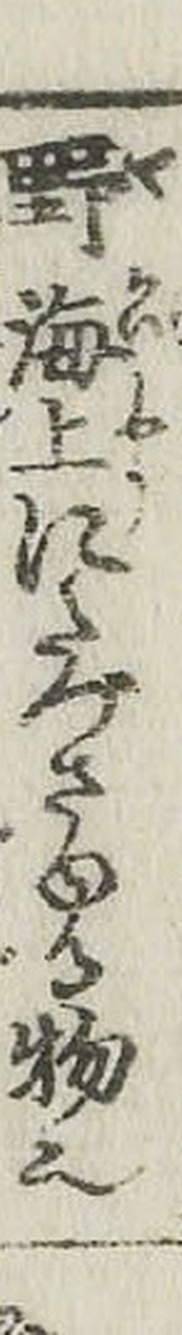野海上にたづさゆる物也
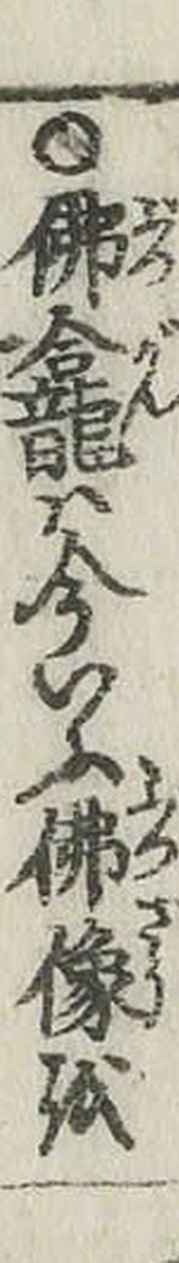○仏龕は今いふ仏像を
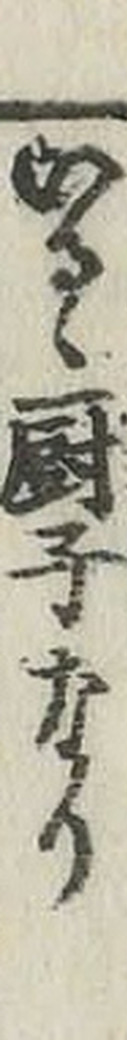いるゝ厨子なり

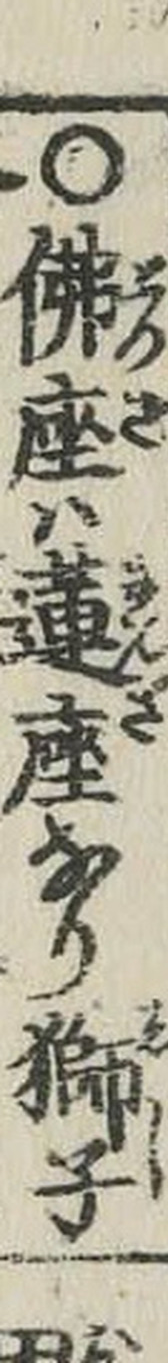○仏座は蓮座なり獅子
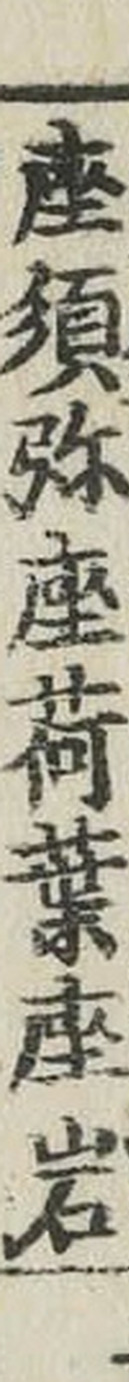座須弥座荷葉座岩
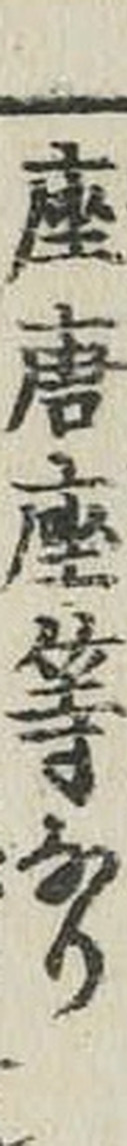座唐座等なり
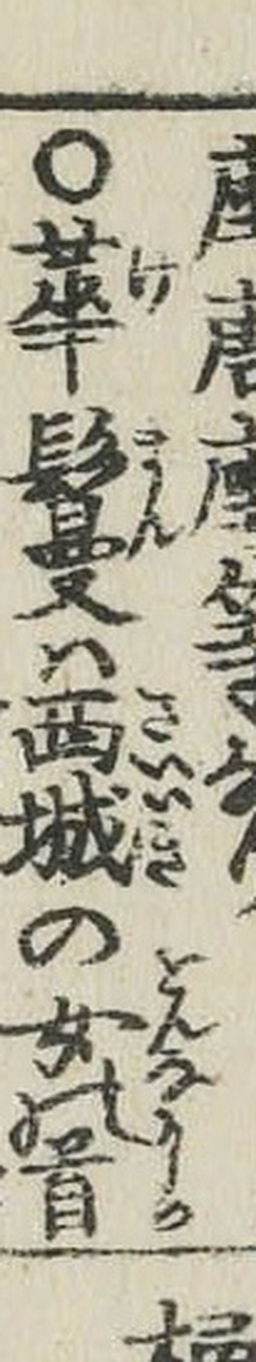○華鬘は西城の女の首
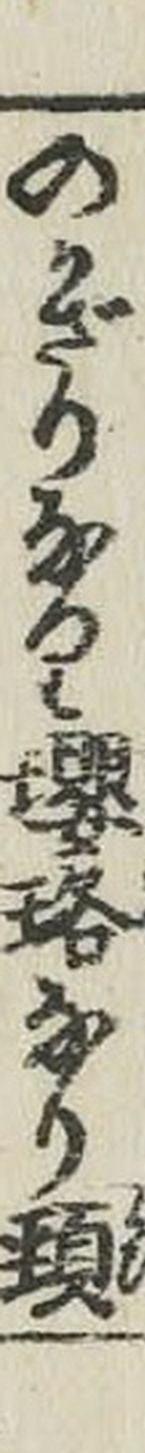のかざりなり瓔珞なり頸
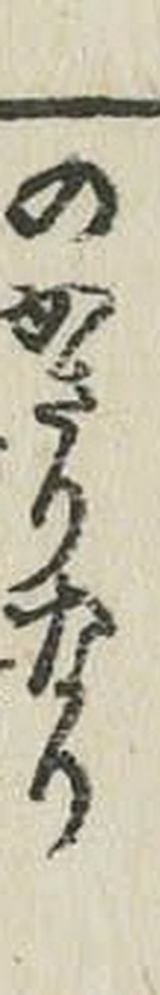のかさりなり
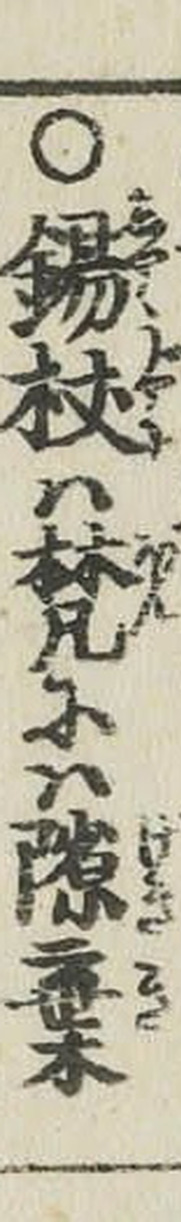○錫杖は梵には隙棄
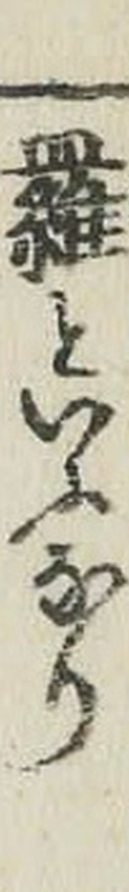羅といふなり
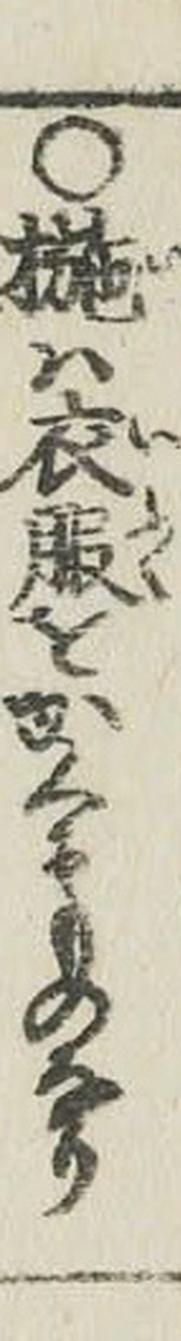○椸は衣服をかくるものなり
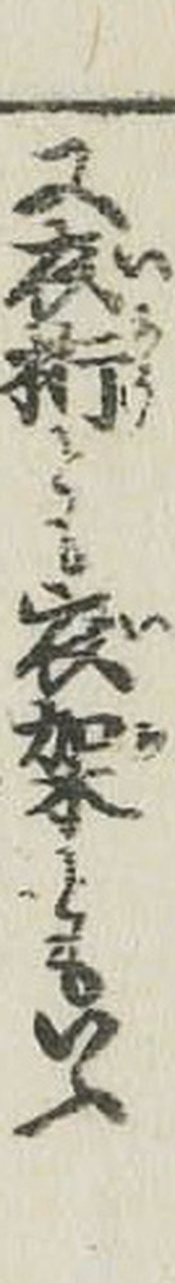又衣桁とも衣架ともいふ
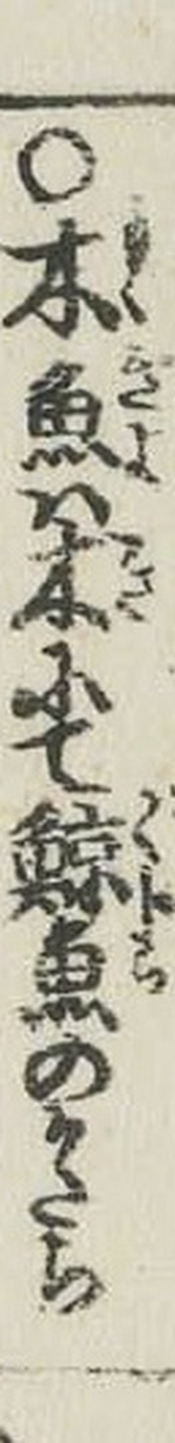○木魚は木にて鯨魚のかたち
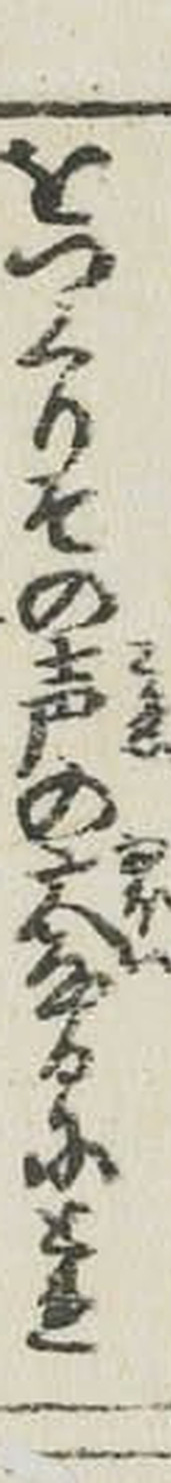をつくりその声の大なるにとれ
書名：増補頭書訓蒙図彙大成 10巻 5:巻之9-11
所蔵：東京学芸大学教育コンテンツアーカイブ
